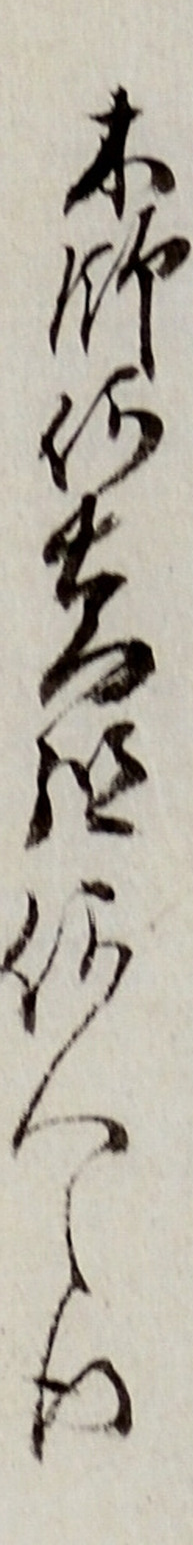木師何者組何人之内
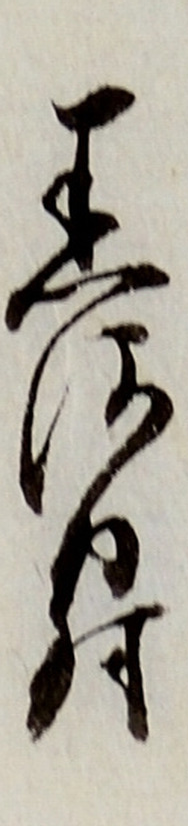黒河内村
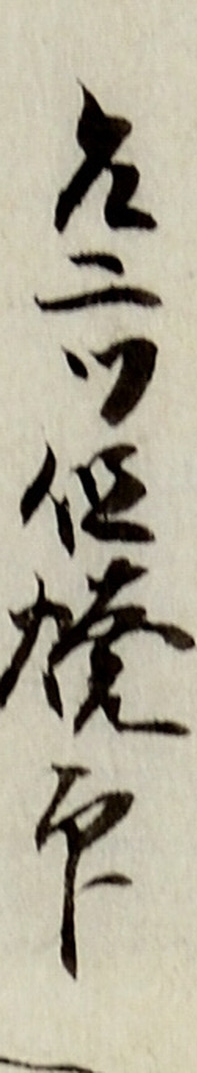左二ツ但焼印
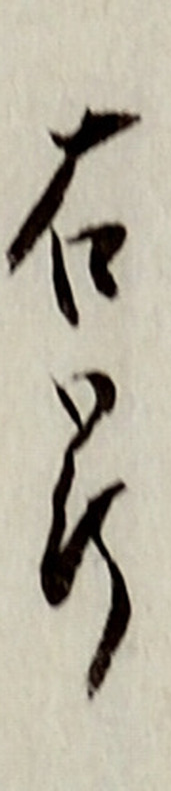右同断
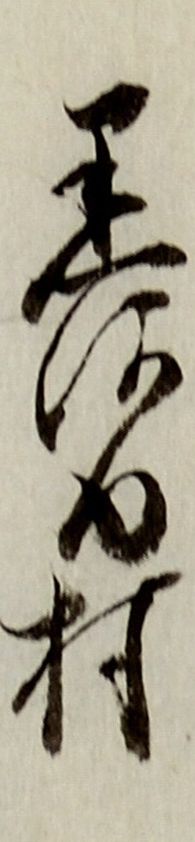黒河内村
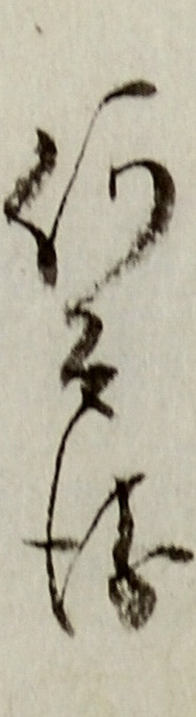何兵衛
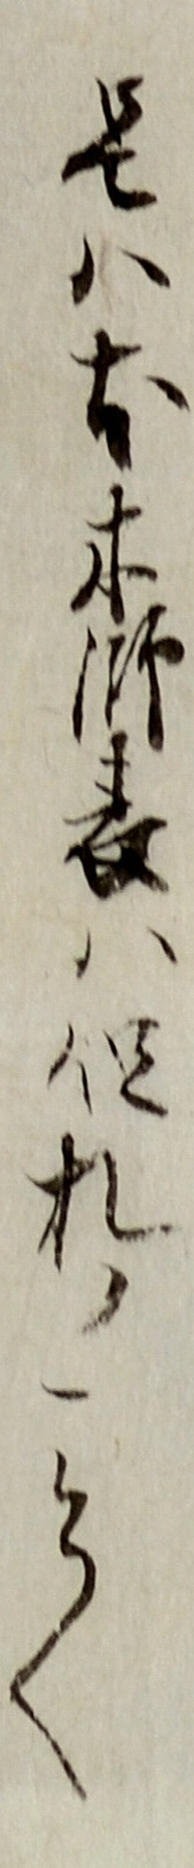是ハ本木師表ハ但札ノことく
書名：木師鑑札并木師名前書等
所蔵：伊那市立高遠町図書館・合同会社AMANE
